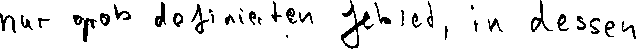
nur grob definierten Gebiet, in dessen
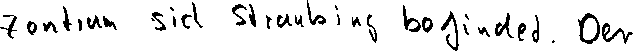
Zentrum sich Straubing befindet. Der
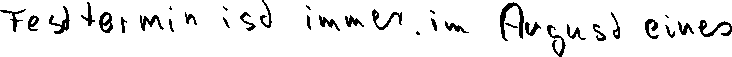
Festtermin ist immer im August eines
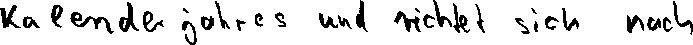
Kalenderjahres und richtet sich nach
